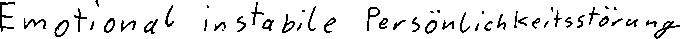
Emotional instabile Persönlichkeitsstörung
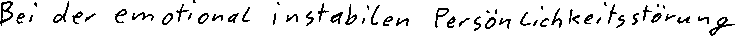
Bei der emotional instabilen Persönlichkeitsstörung
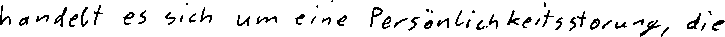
handelt es sich um eine Persönlichkeitsstörung, die
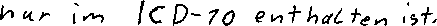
nur im ICD-10 enthalten ist.
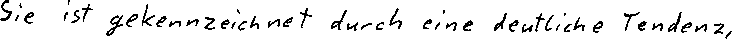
Sie ist gekennzeichnet durch eine deutliche Tendenz,
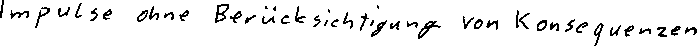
Impulse ohne Berücksichtigung von Konsequenzen
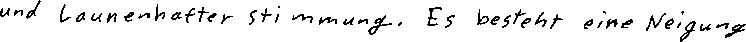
und launenhafter Stimmung. Es besteht eine Neigung
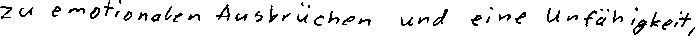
zu emotionalen Ausbrüchen und eine Unfähigkeit,
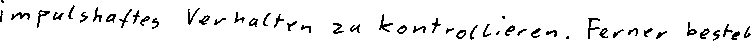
impulshaftes Verhalten zu kontrollieren. Ferner besteht
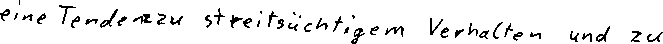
eine Tendenz zu streitsüchtigem Verhalten und zu
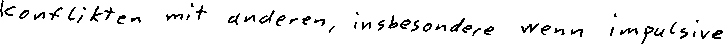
Konflikten mit anderen, insbesondere wenn impulsive
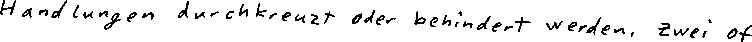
Handlungen durchkreuzt oder behindert werden.Zwei oft
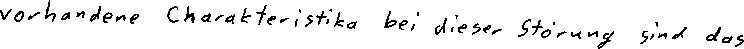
vorhandene Charakteristika bei dieser Störung sind das
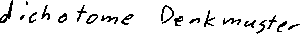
dichotome Denkmuster
